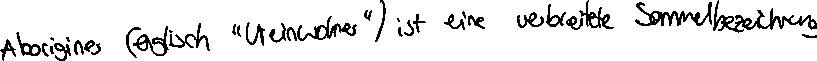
Aborigines (englisch "Ureinwohner") ist eine verbreitete Sammelbezeichnung
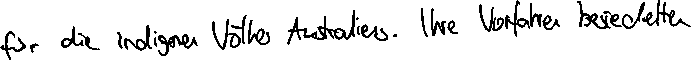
für die indigenen Völker Australiens. Ihre Vorfahren besiedelten
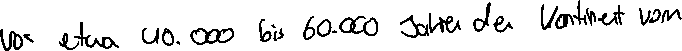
vor etwa 40.000 bis 60.000 Jahren den Kontinent vom
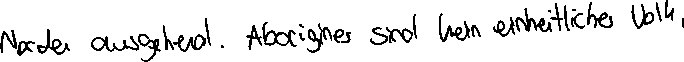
Norden ausgehend. Aborigines sind kein einheitliches Volk,
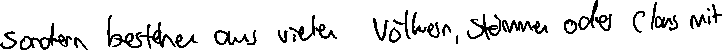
sondern bestehen aus vielen Völkern, Stämmen oder Clans mit
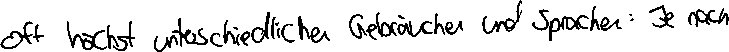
oft höchst unterschiedlichen Gebräuchen und Sprachen: Je nach
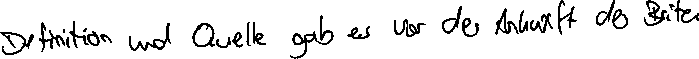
Definition und Quelle gab es vor der Ankunft der Briten
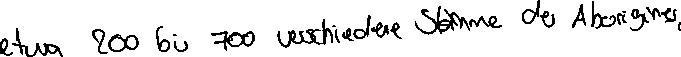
etwa 200 bis 700 verschiedene Stämme der Aborigines,
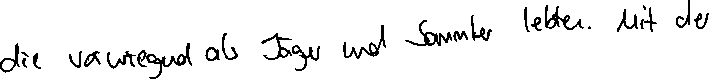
die vorwiegend als Jäger und Sammler lebten. Mit der
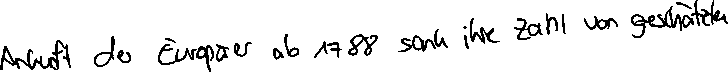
Ankunft der Europäer ab 1788 sank ihre Zahl von geschätzten
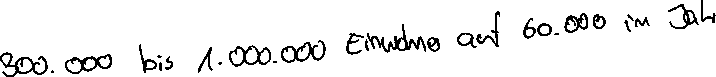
300.000 bis 1.000.000 Einwohnern auf 60.000 im Jahr
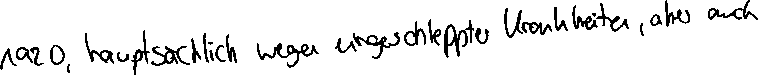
1920, hauptsächlich wegen eingeschleppter Krankheiten, aber auch
